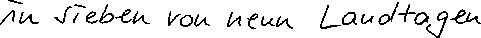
in sieben von neun Landtagen
